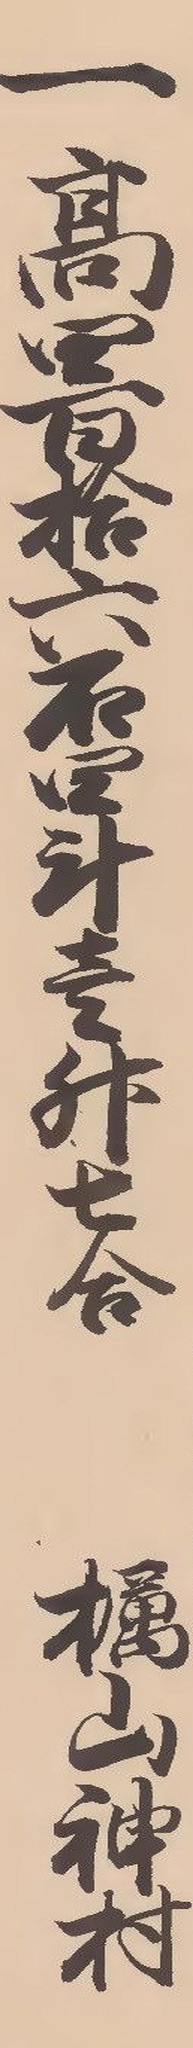一高四百拾六石四斗壱升七合栃山神村
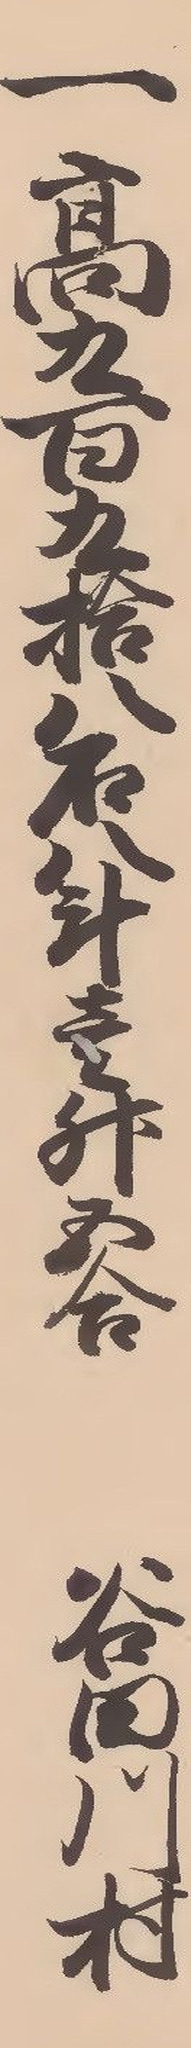一高九百九拾八石八斗壱升五合谷田川村
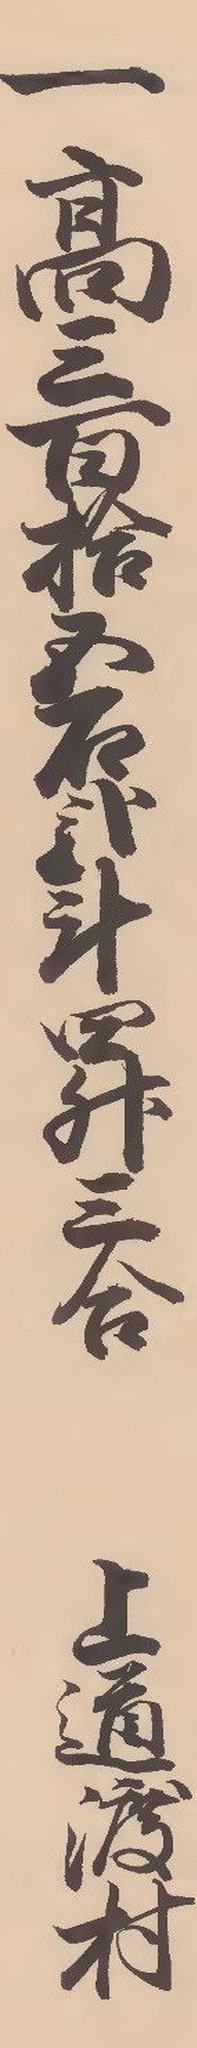一高三百拾五石弐斗四升三合上道渡村
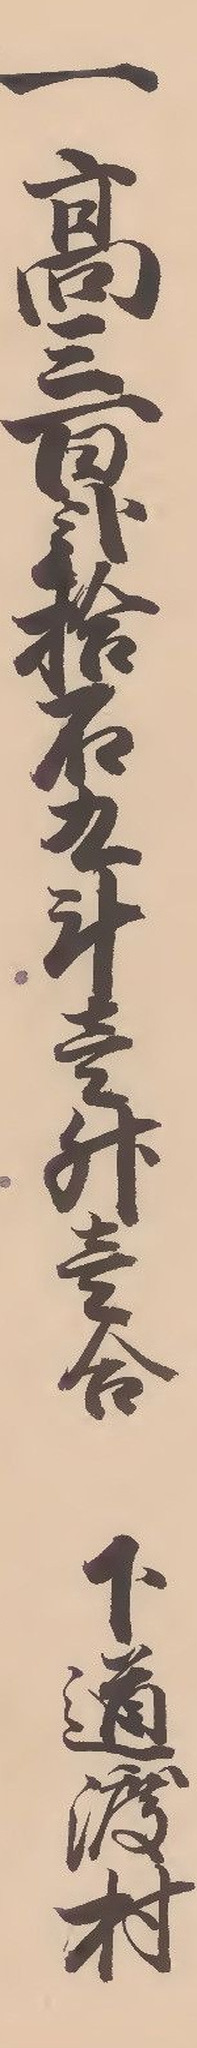一高三百弐拾石五斗壱升壱合下道渡村

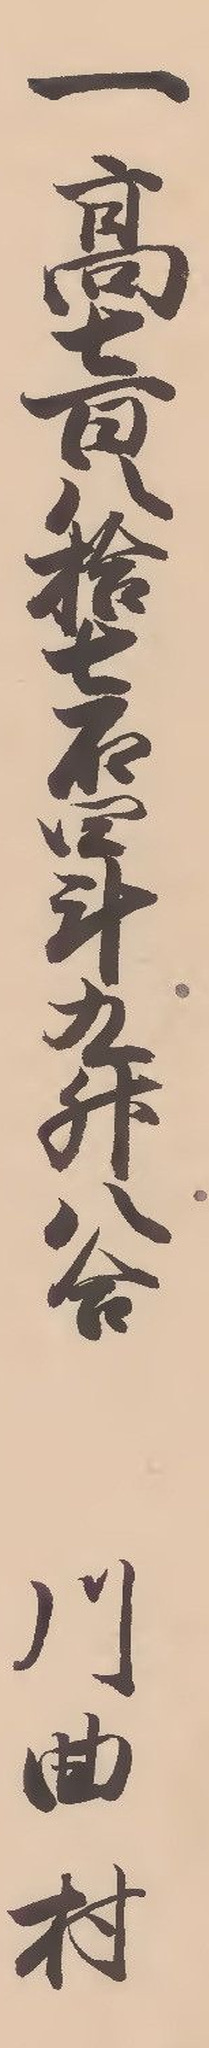一高七百八拾七石四斗九升八合川曲村
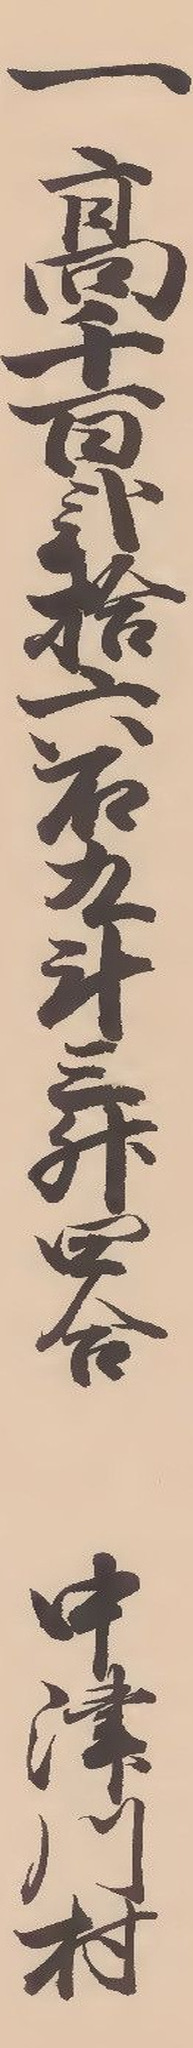一高千百弐拾六石九斗三升四合中津川村
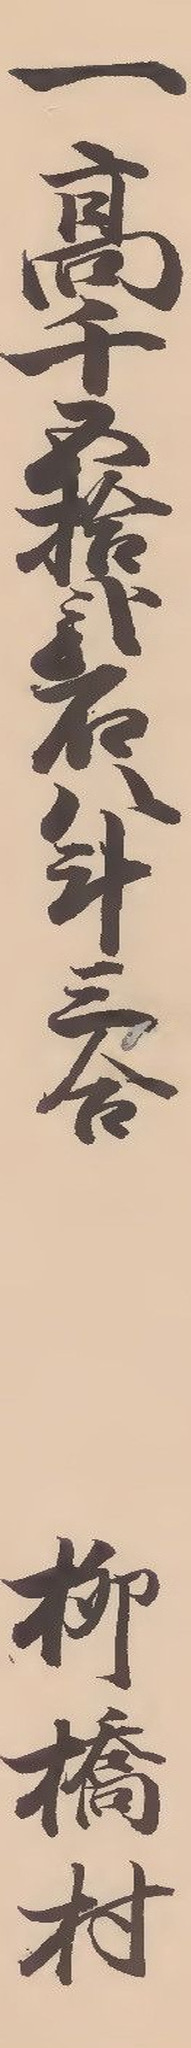一高千五拾弐石八斗三合柳橋村
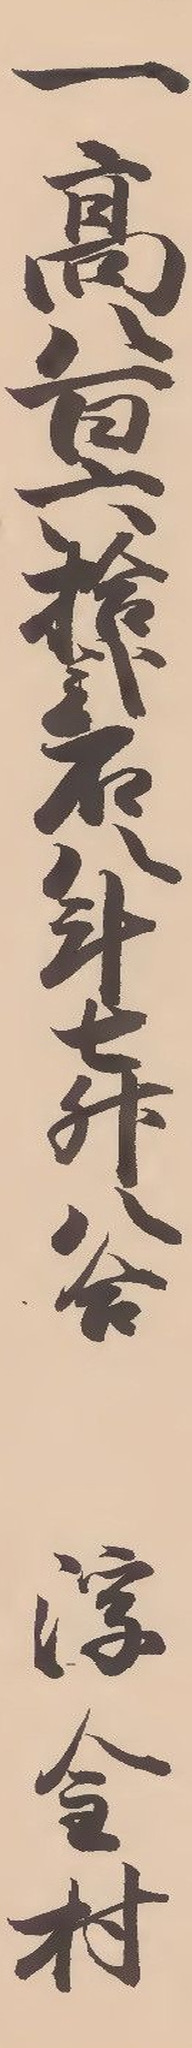一高八百六拾弐石八斗七升八合浮金村
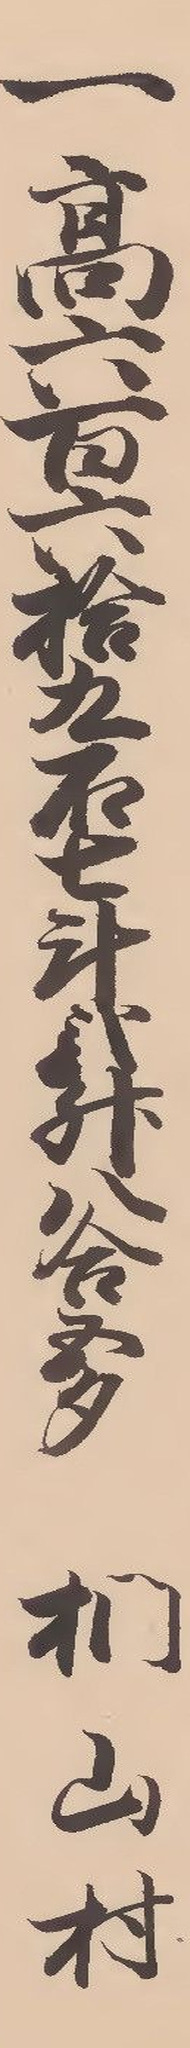一高六百六拾九石七斗弐升八合五勺椚山村
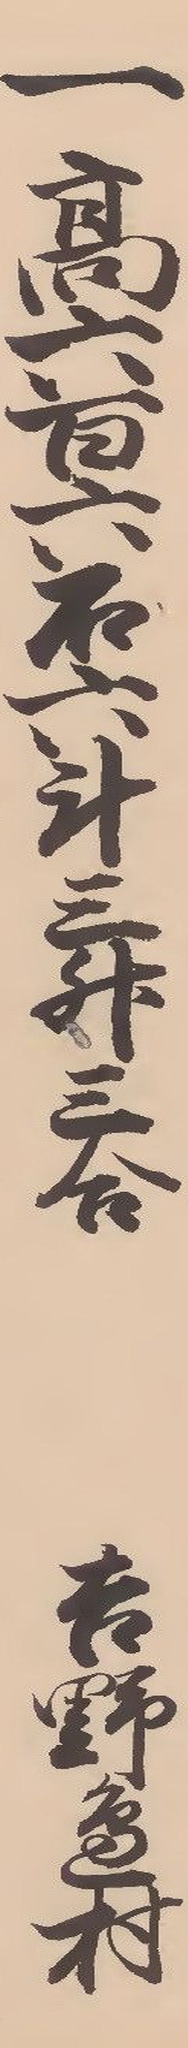一高六百六石六斗三升三合吉野辺村
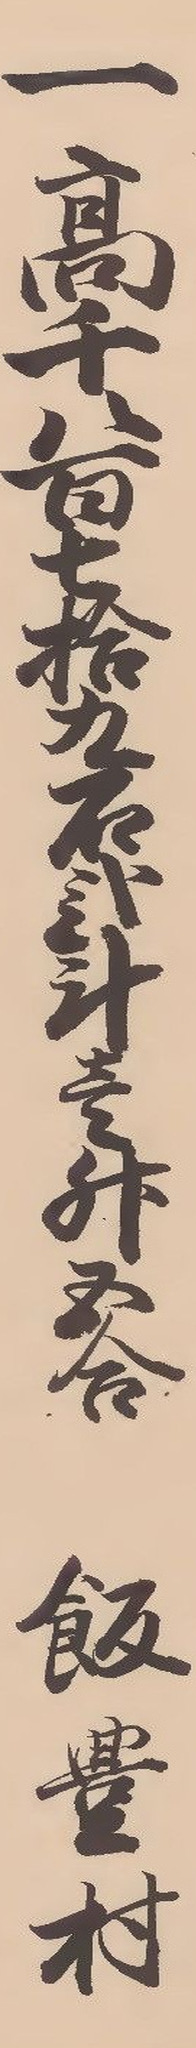一高千八百七拾九石弐斗壱升五合飯豊村
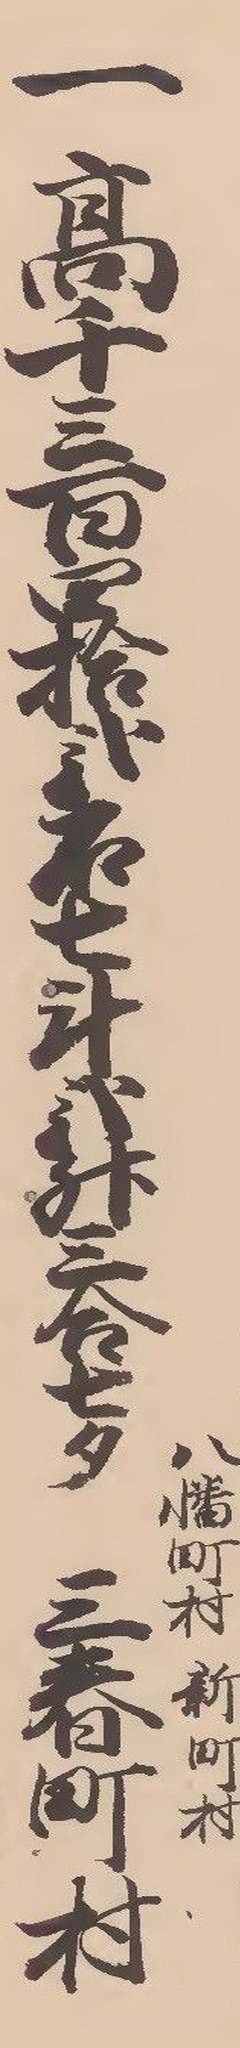一高千三百四拾弐石七斗弐升三合七勺三春町村

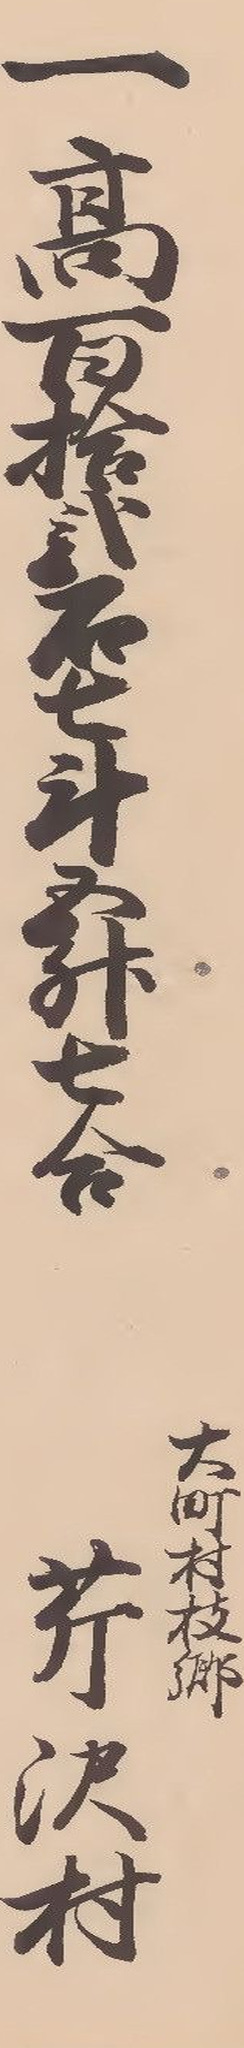一高百拾弐石七斗五升七合芹沢村
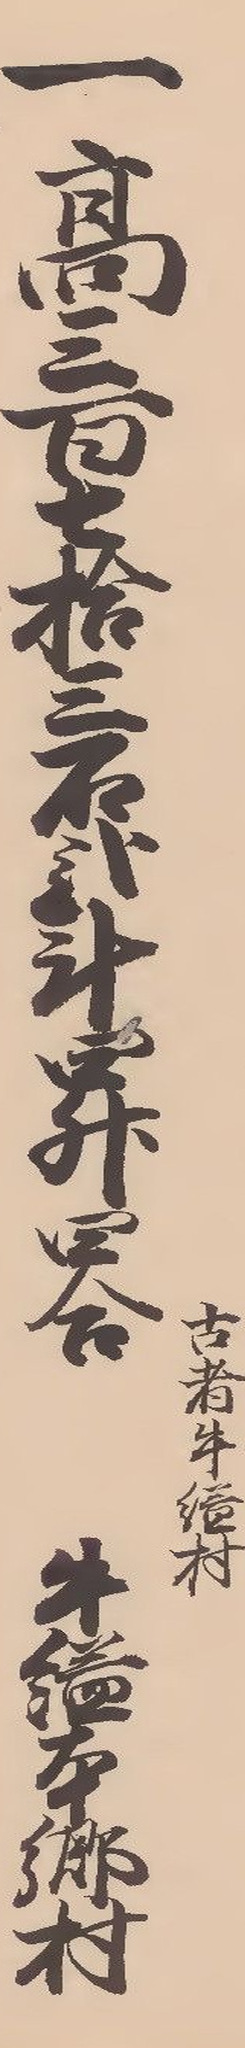一高三百七拾三石弐斗四升四合牛縊本郷村
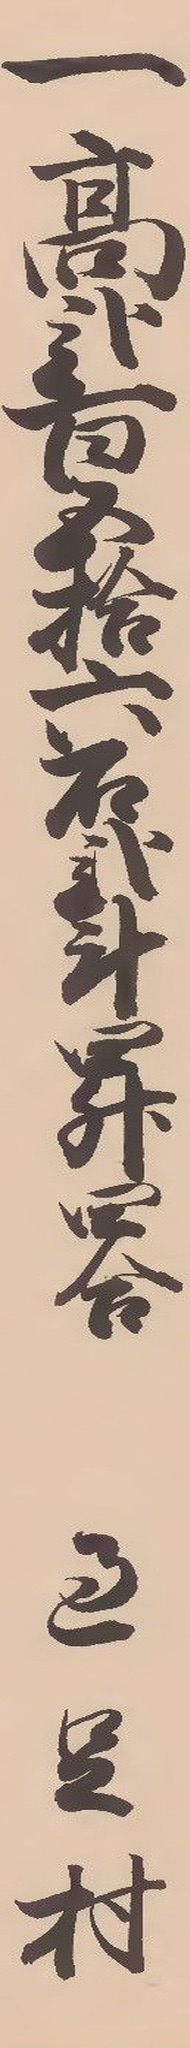一高弐百五拾六石弐斗四升四合過足村
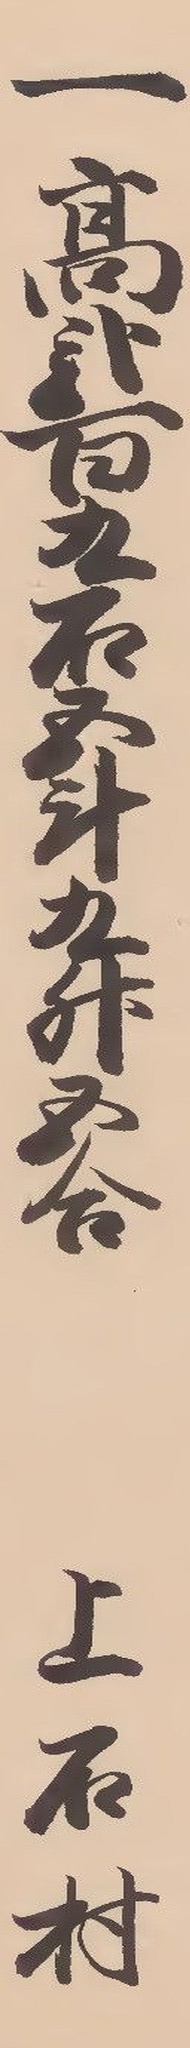一高弐百九石五斗九升五合上石村
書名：陸奥国郷帳　２
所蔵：国立公文書館 National Archives of Japan
